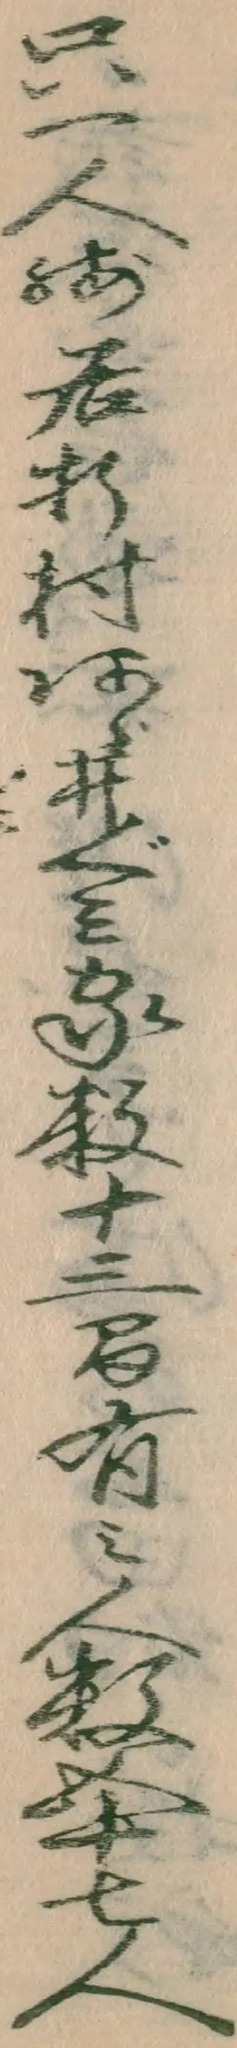只一人残居折村あら井ぐみ家数十三間有之人数五十七人
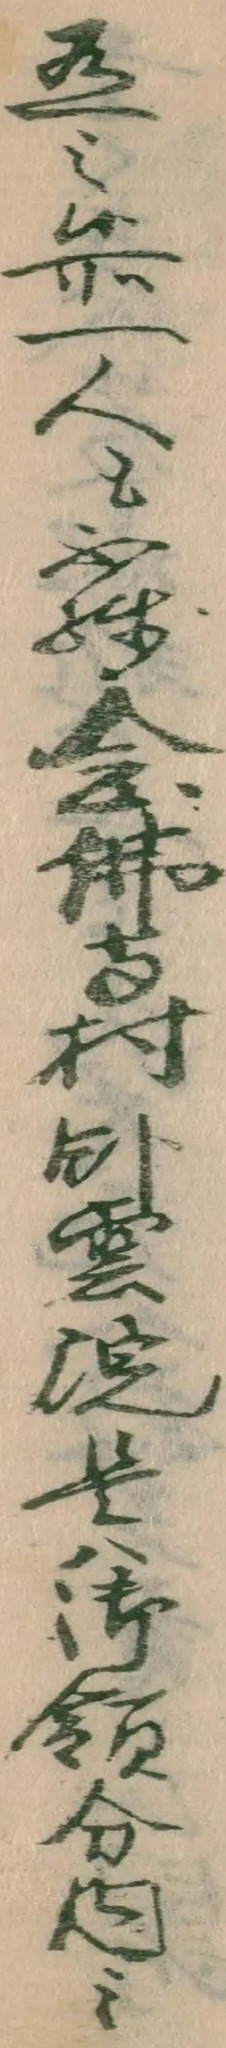有之候所一人も不残念仏寺村臥雲院是は御領分内之
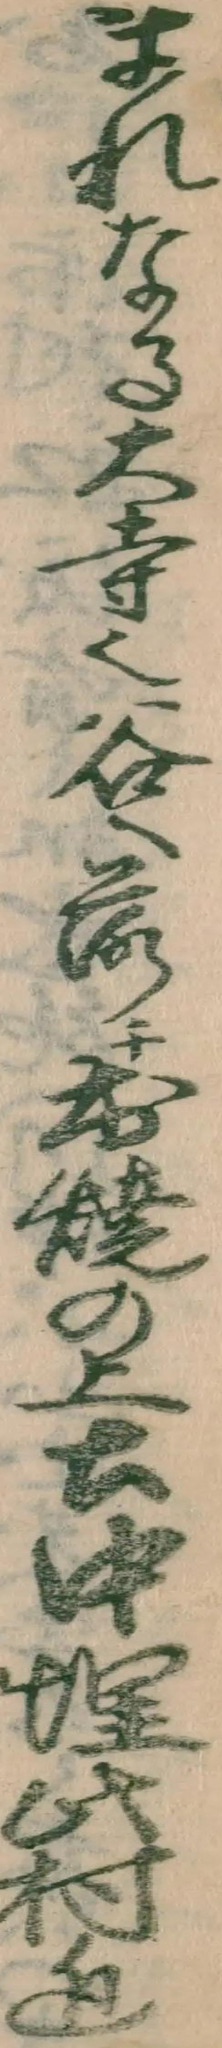まれなる大寺也谷へ落チ出焼の上土中埋此村近
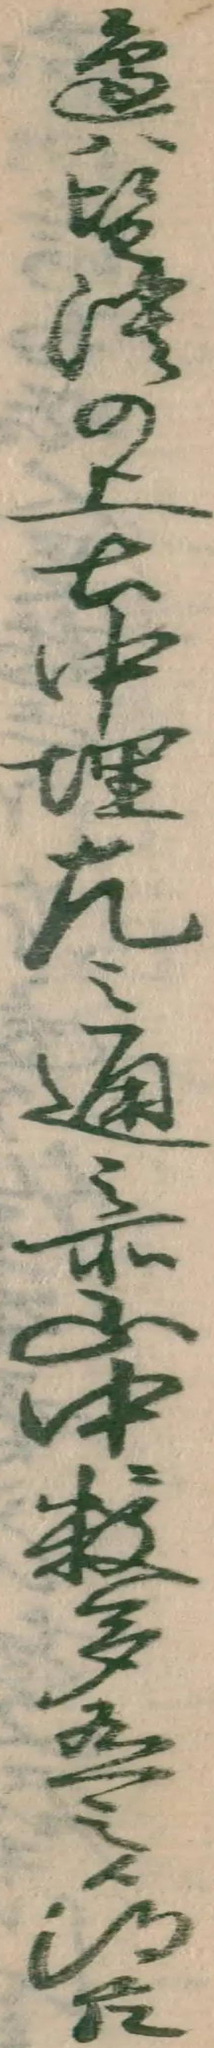辺は皆潰の上土中埋左之通之所山中ニ数多有之候得共
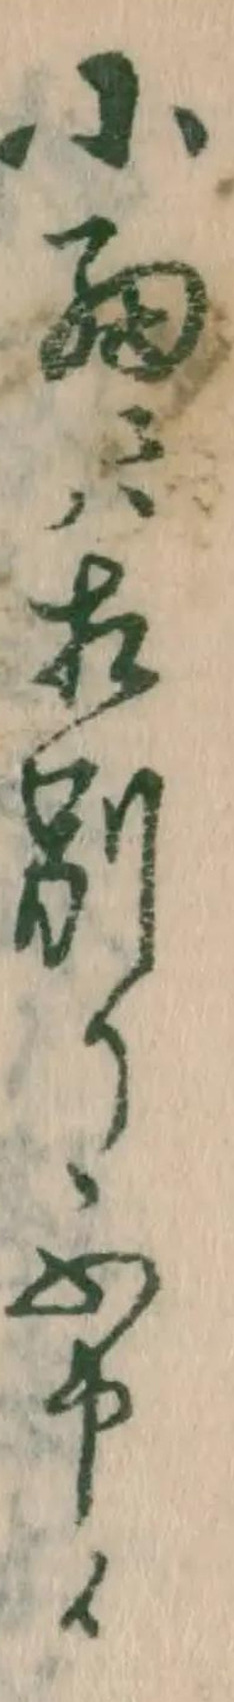小細二は相別り不申候
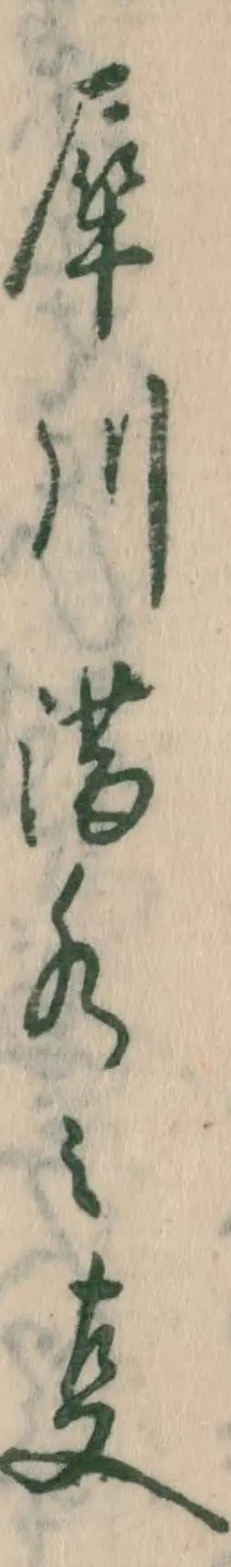犀川満水之事
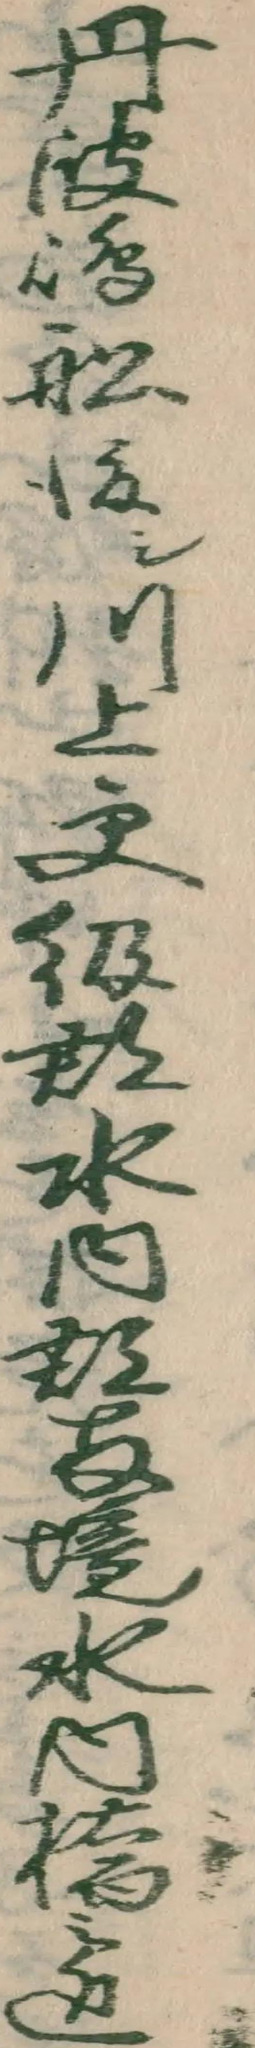丹波嶋船渡シ川上更級郡水内郡両境水内橋之近
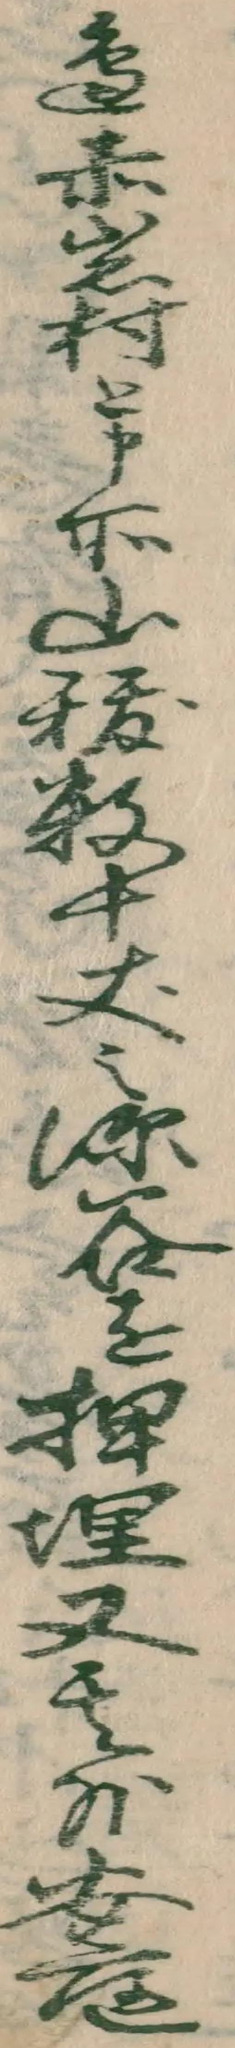辺赤岩村と申所山抜数十丈之深谷を押埋又其外安庭
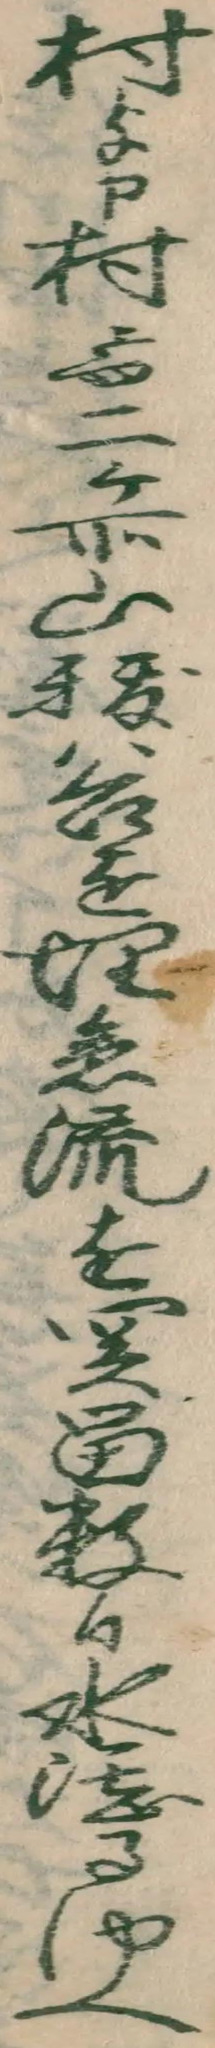村与申村二而二ヶ所山抜谷を埋急流を関留数日水湛るゆへ
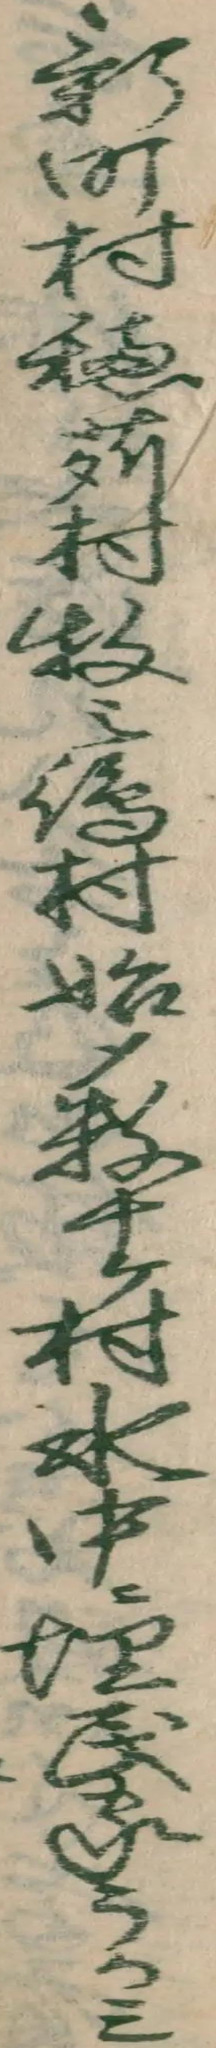新町村穂苅村牧之嶋村始メ数十ヶ村水中二埋民家うかみ

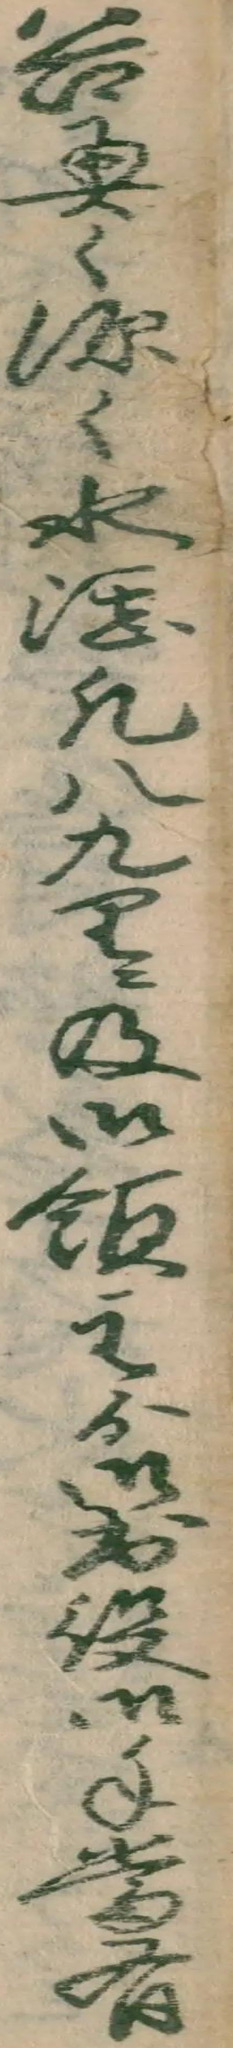谷奥く深く水湛凡八九里二及御領主ゟ御出役御手当有
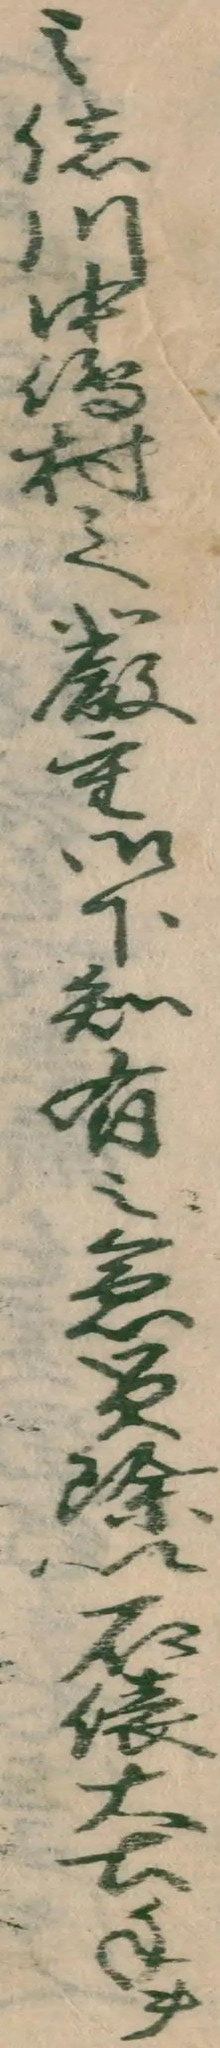之偖川中嶋村々へ厳重御下知有之急災除以石俵大土手ヲ
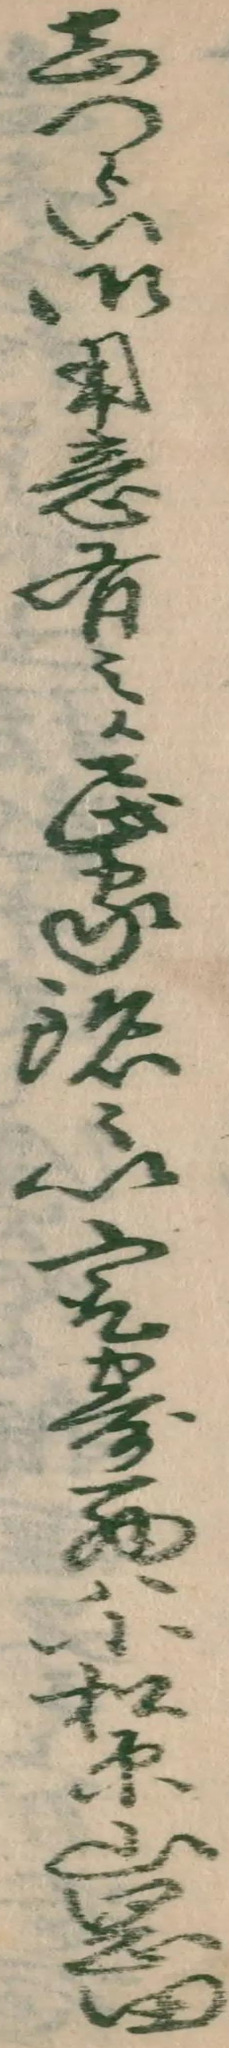しつらい御用意有之候民家銘々以最寄西は小松原山岡田
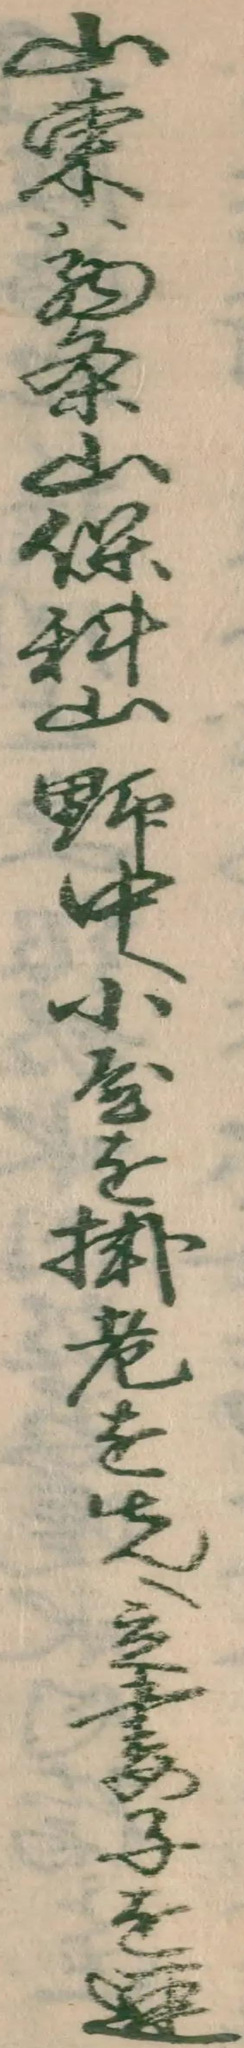山東は西条山保科山野中へ小屋を掛老を先二立妻子を連
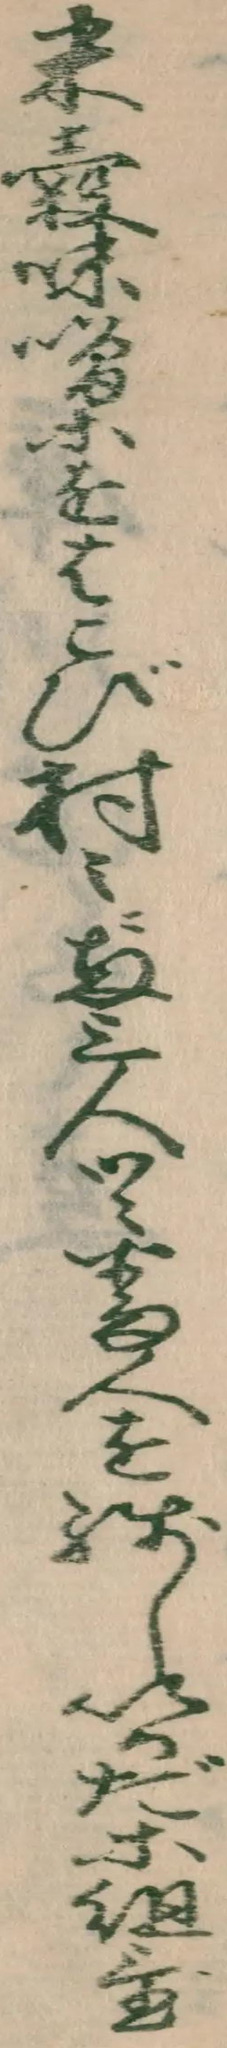米穀味噌等をはこび村々二両三人ツゝ番人を残しいかだ等組置
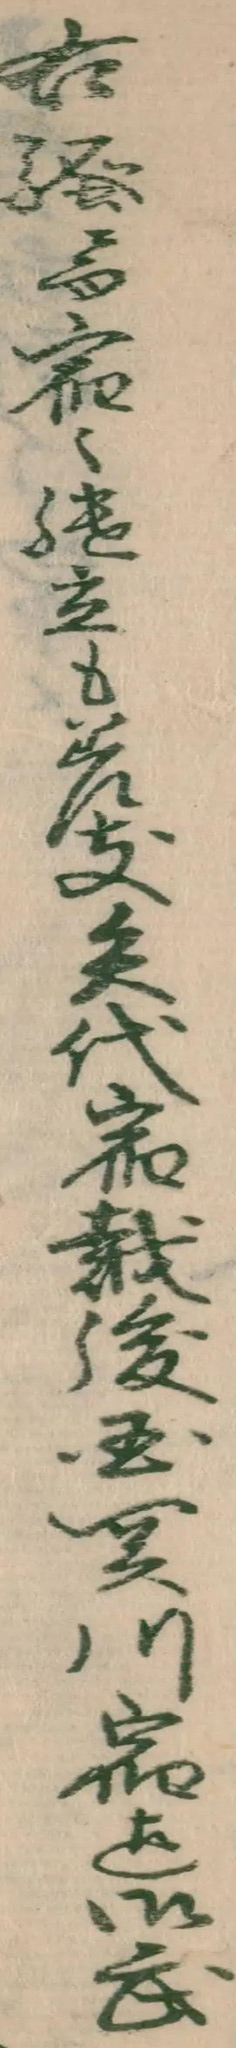右騒二而宿々継立も差支矢代宿越後国関川宿迄御武
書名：大地震
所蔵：国立国会図書館 National Diet Library, JAPAN
